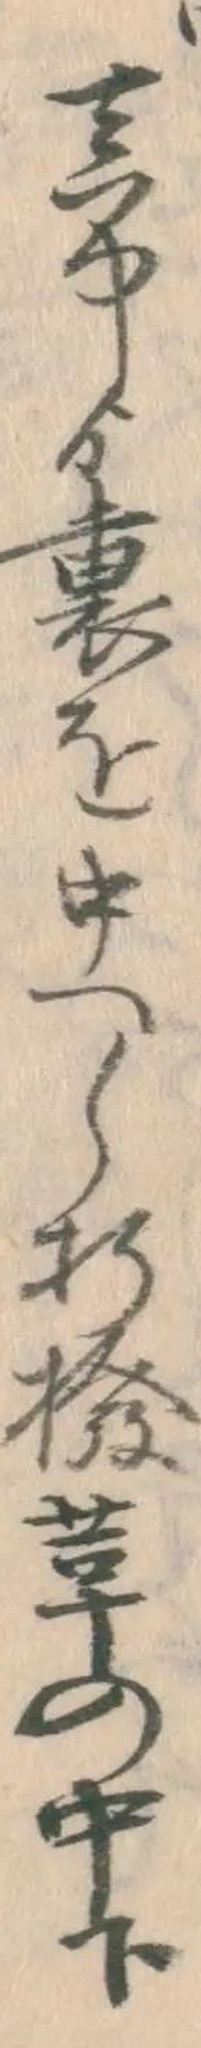真中ゟ裏を中へし折撥革の中下
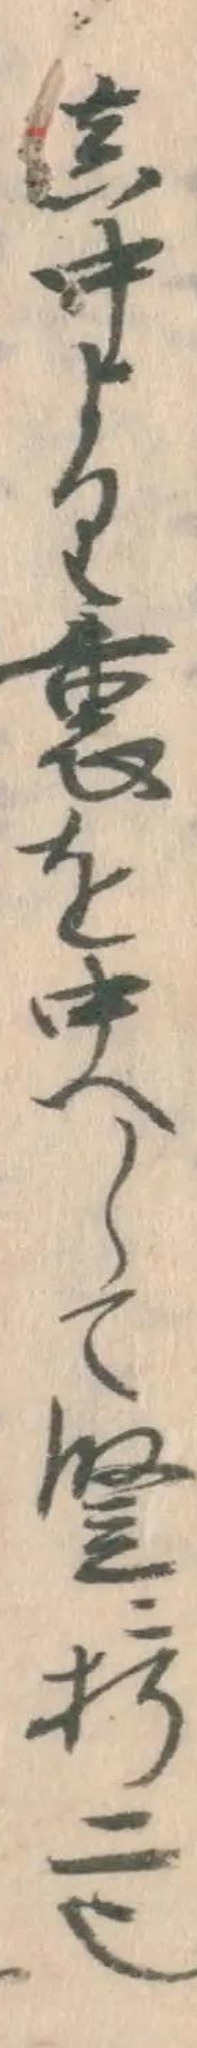真中より裏を中へして竪ニ折二也
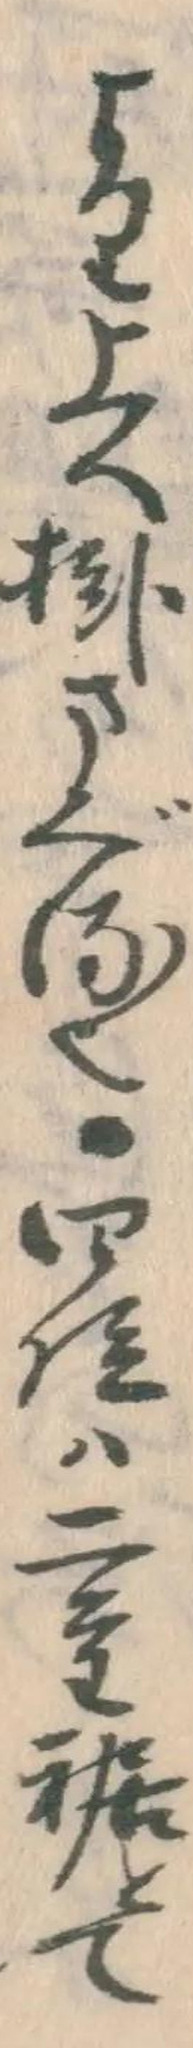より上へ掛さぐる也・四位ハ二重裾とて
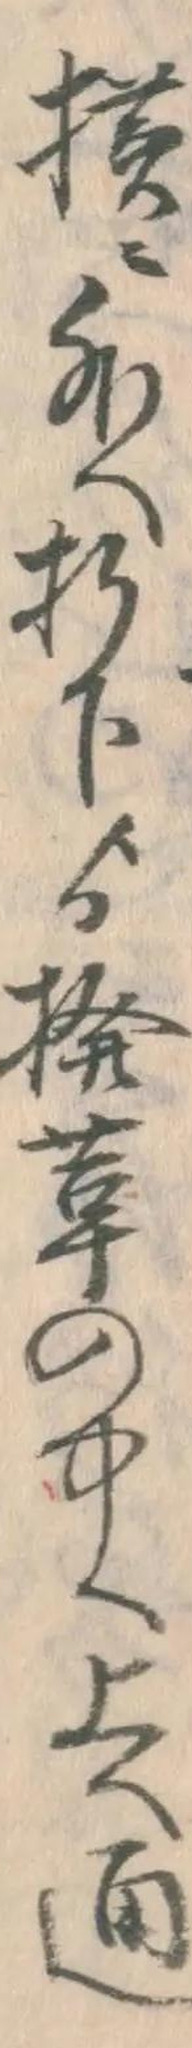横ニ外へ折下ゟ撥革の中へ上へ通
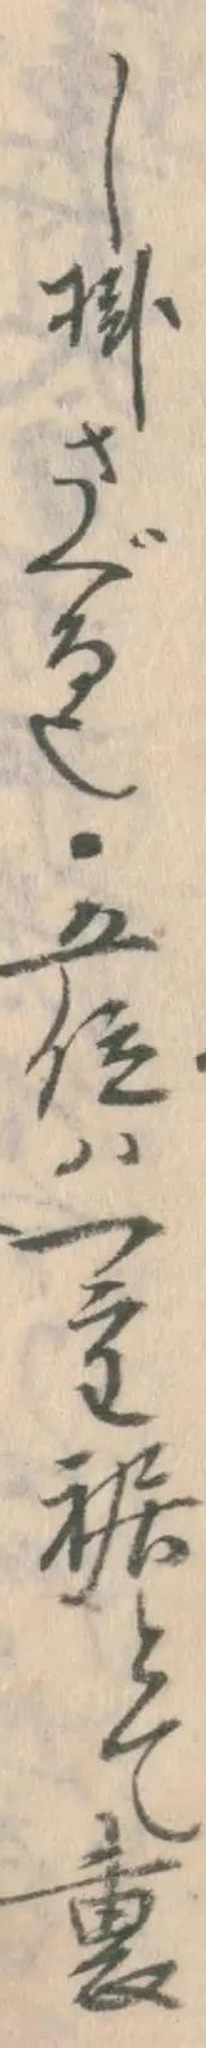し掛さぐる也・五位ハ一重裾とて裏
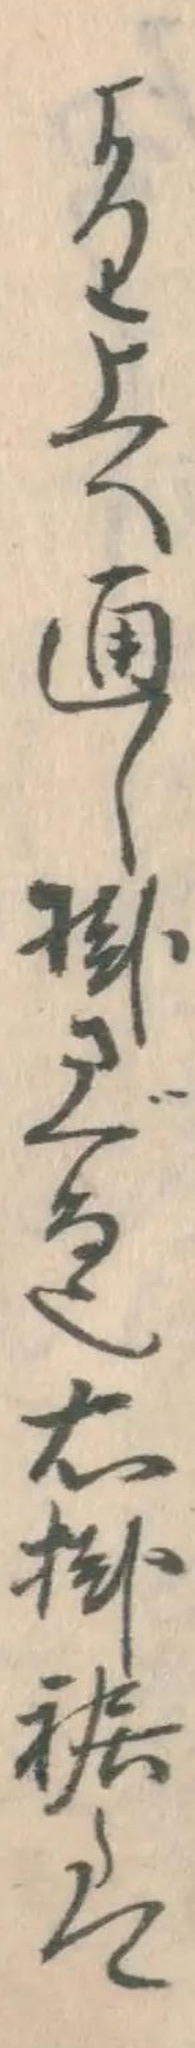より上へ通し掛さぐる也右掛裾は
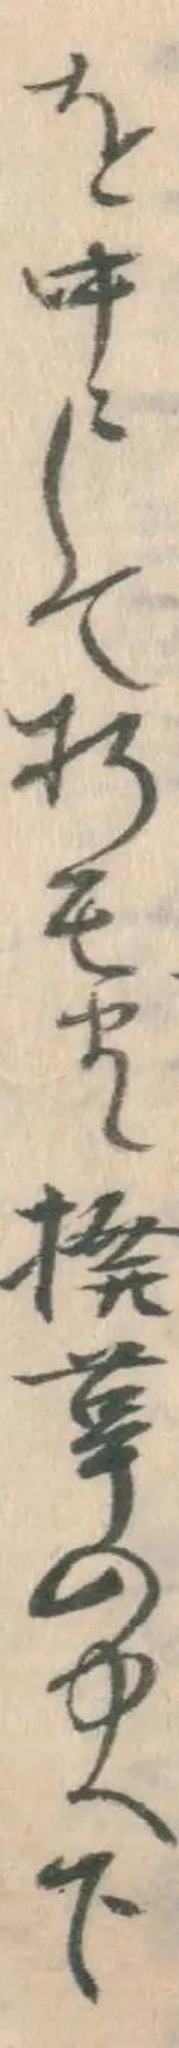を中ニして折其まゝ撥革の中へ下
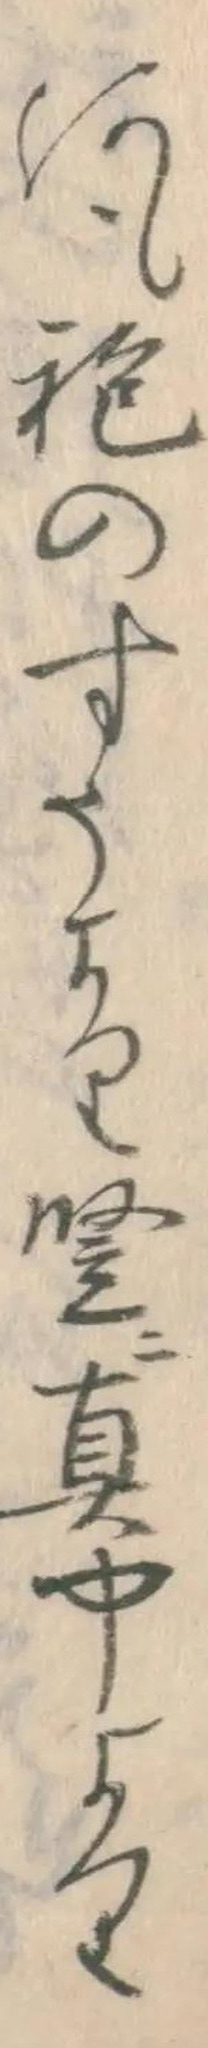何も袍のすうより竪ニ真中より
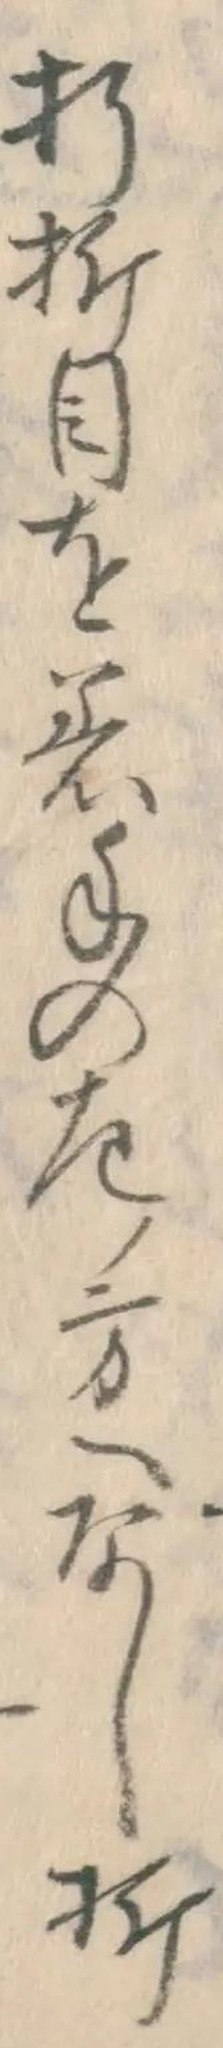折折目を着手の左ノ方へなし折
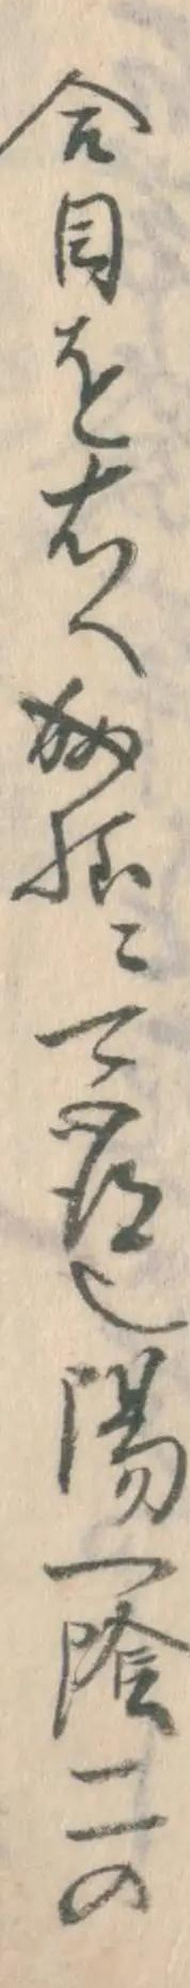合目を右へ成様ニ可心得也陽一陰二の
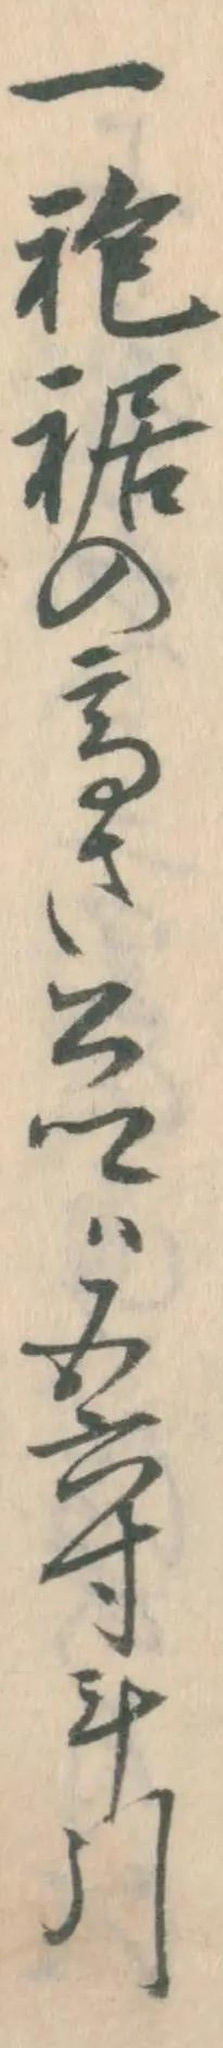一袍裾の高さ公卿ハ五六寸斗引

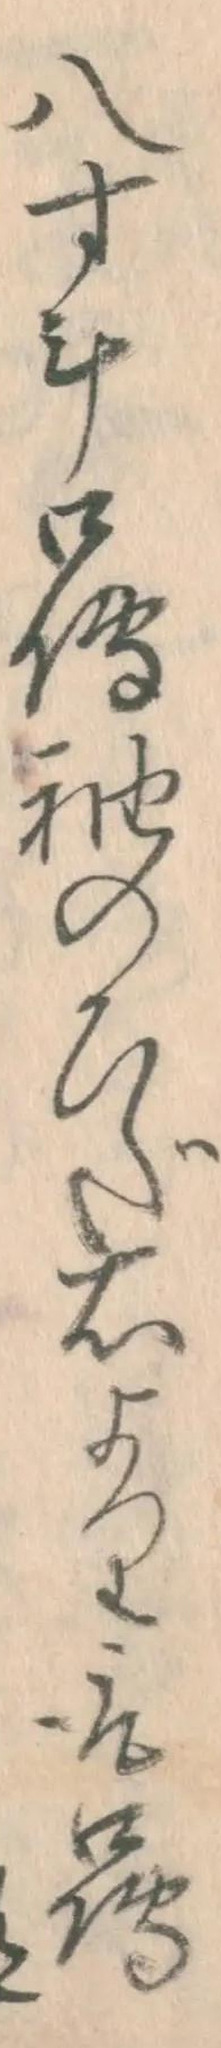八寸斗口伝袖のひだ右より取口伝有
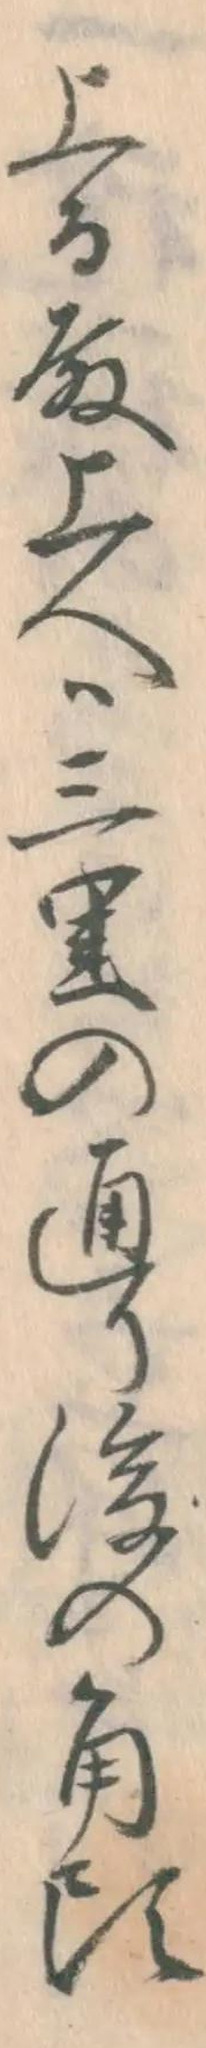上る殿上人ハ三里の通り後の角頭
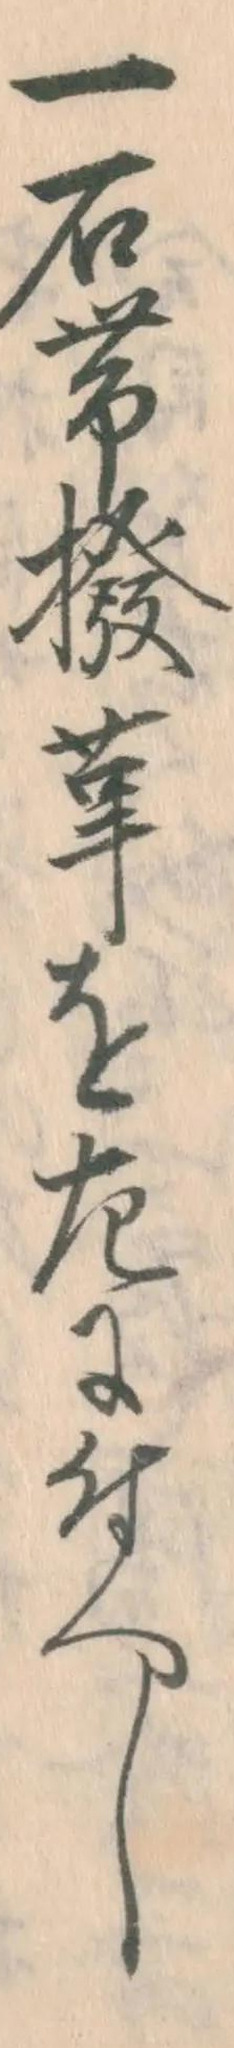一石帯撥革を左に付へし
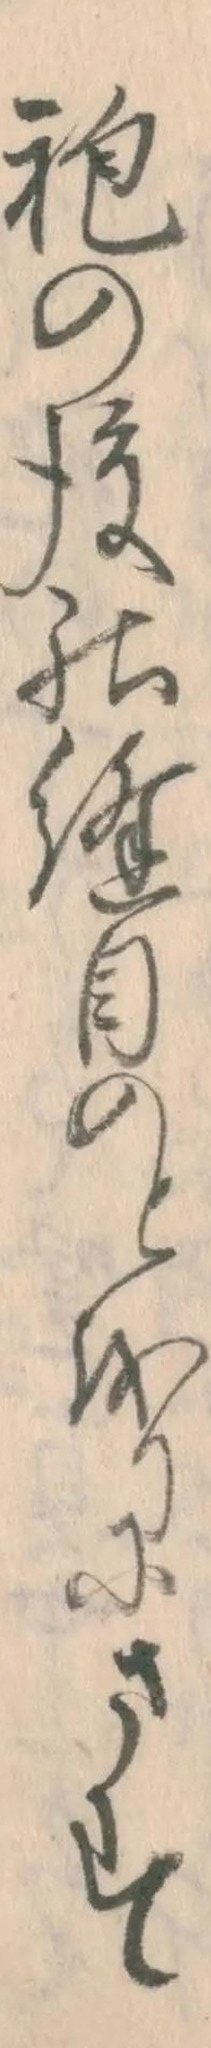袍の後の縫目のとをりにさす
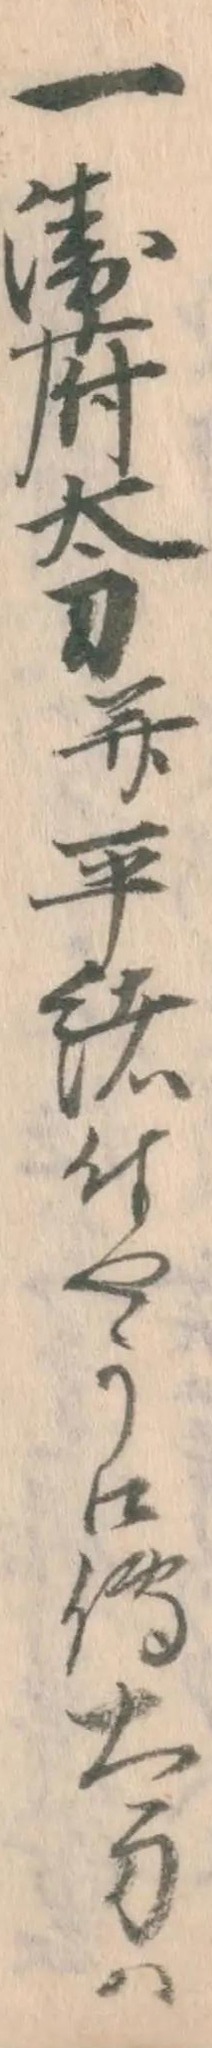一衛府太刀并平緒付やう口伝太刀ハ
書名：賀茂社記録. 第80冊
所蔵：国立国会図書館 National Diet Library, JAPAN
